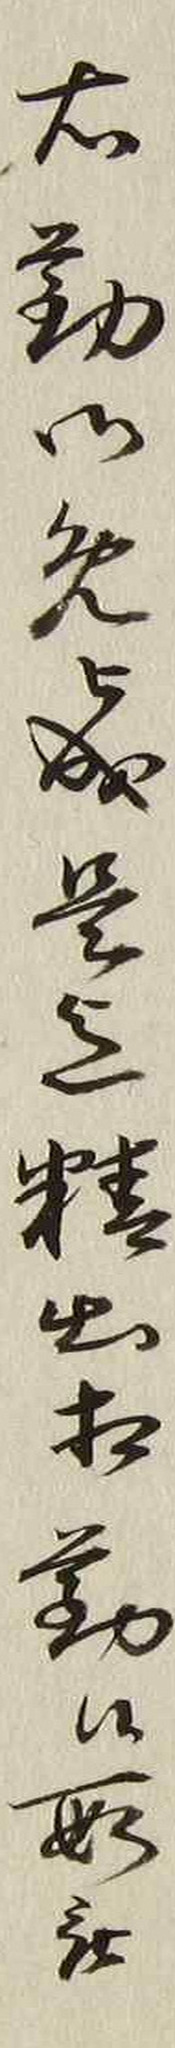右勤御めみえ成是迄精出相勤候所被
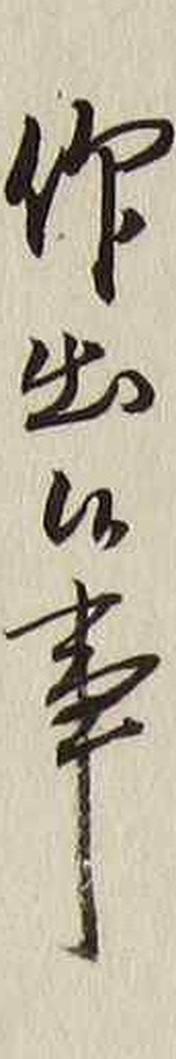仰出候事
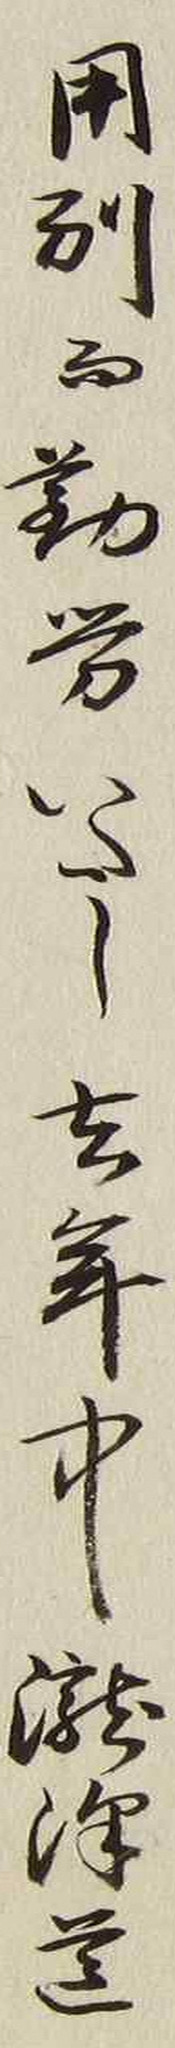用別而勤労いたし去年中滝津道
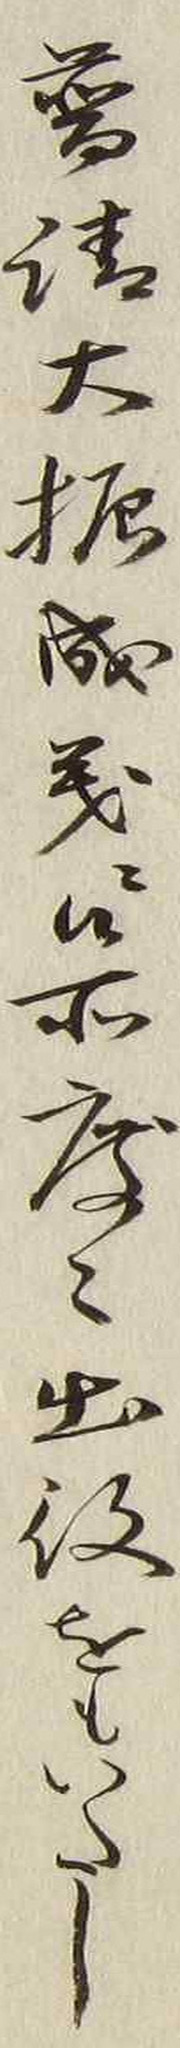普請大振成義に候所度々出役をもいたし

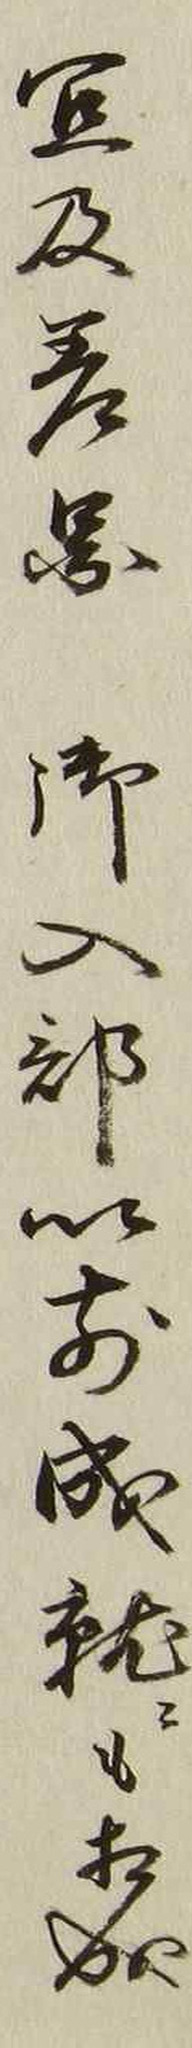宜及差図御入葡部以前成就にも相な
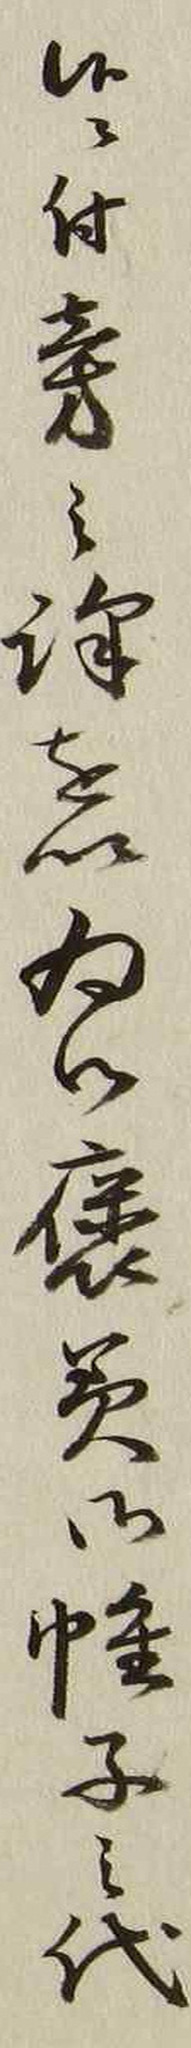候に付旁之彼をいゐ御褒美御性子之代
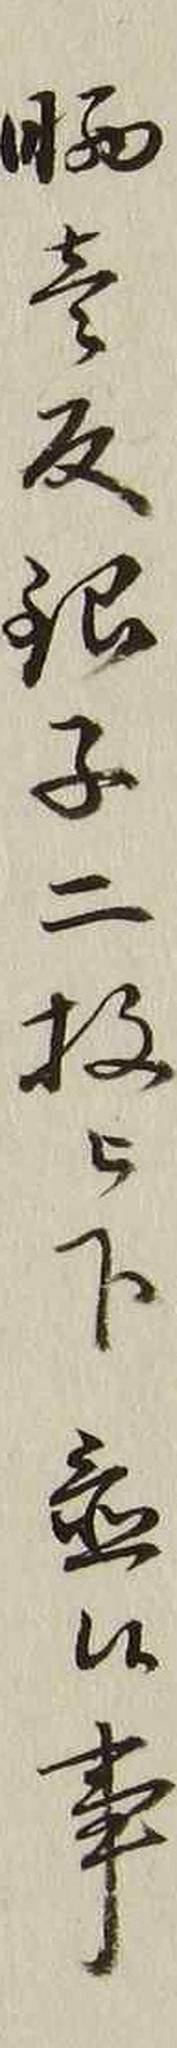晒壱反銀子二枚御下置候事
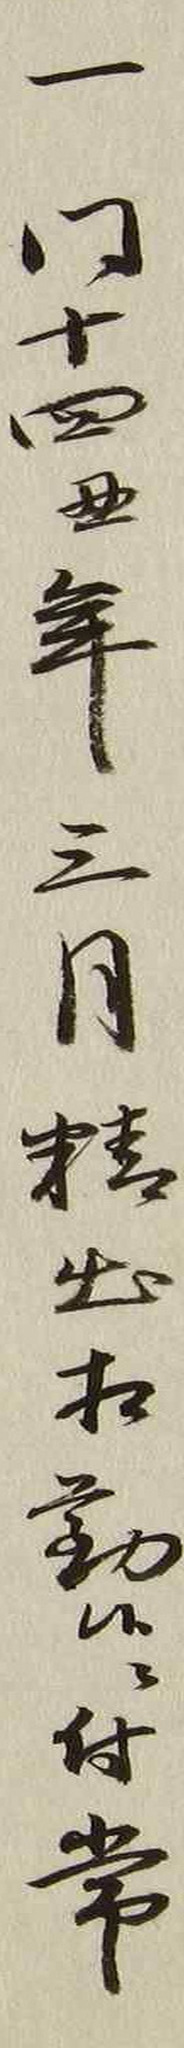一同十四丑年三月精出相勤候に付常
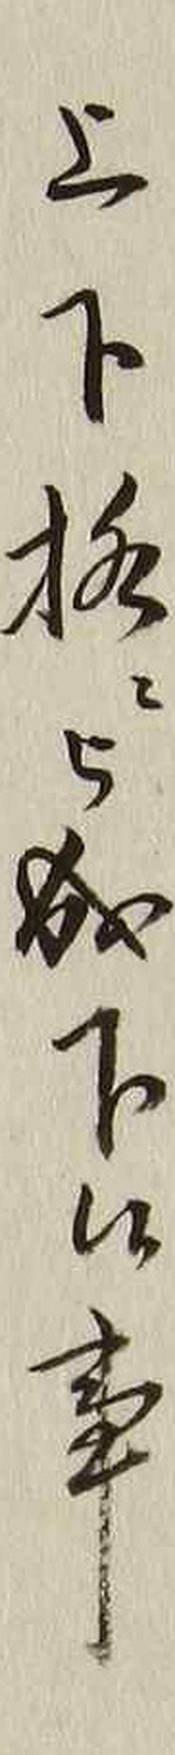上下格に与成候事
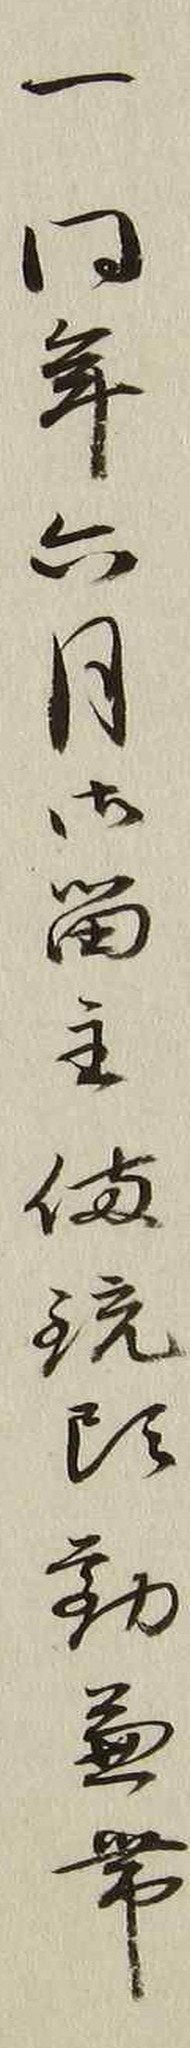一同年六月御留主備琉頭動兼帯
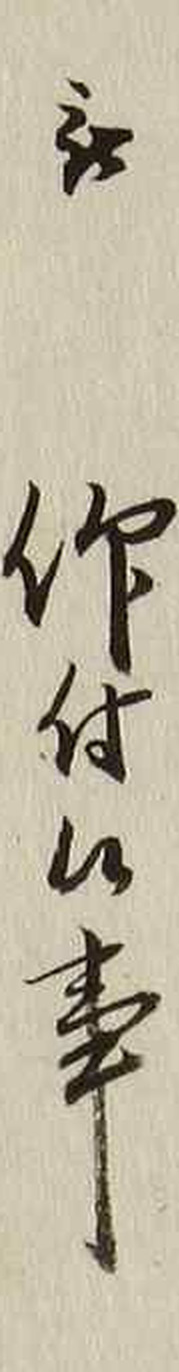被仰付候事
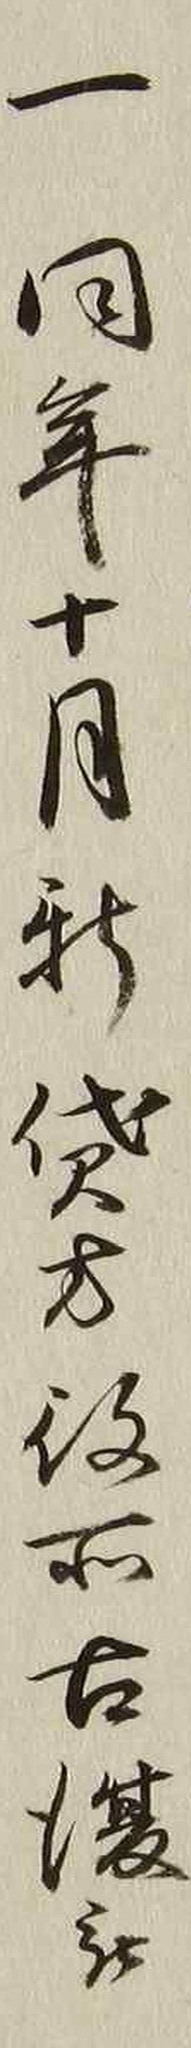一同年十月新貸方後所古復被
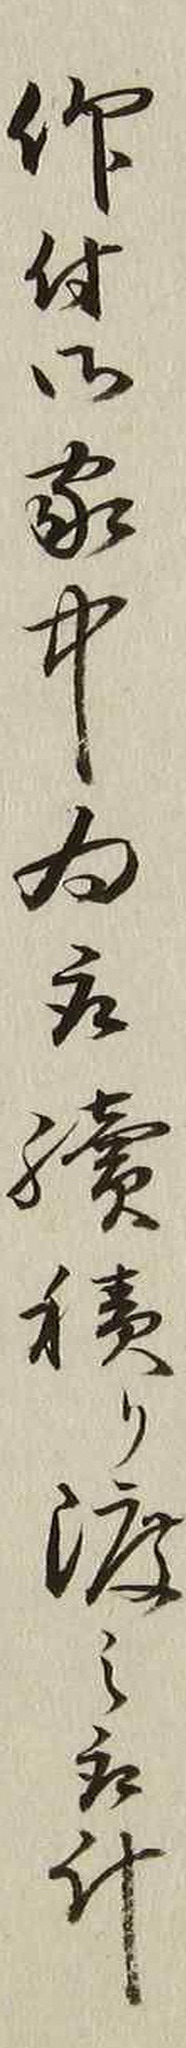仰付御家中ゐ読積り渡之取計
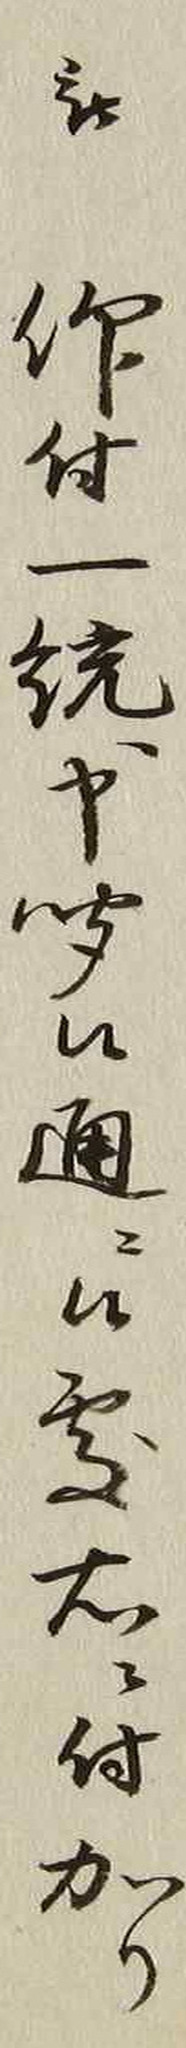被仰付一統中聞候通に候処右に付かり
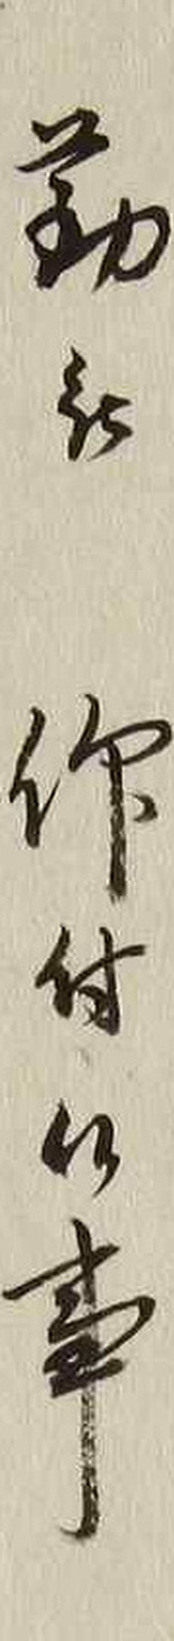勤被仰付候事
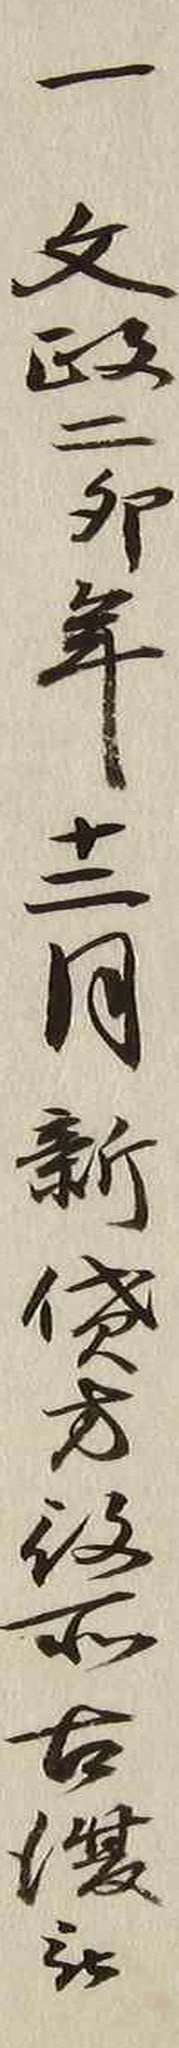一文政二卯年十二月新貸方後所古復被
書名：諸士系譜　巻之160　な之部2
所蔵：会津若松市立会津図書館
